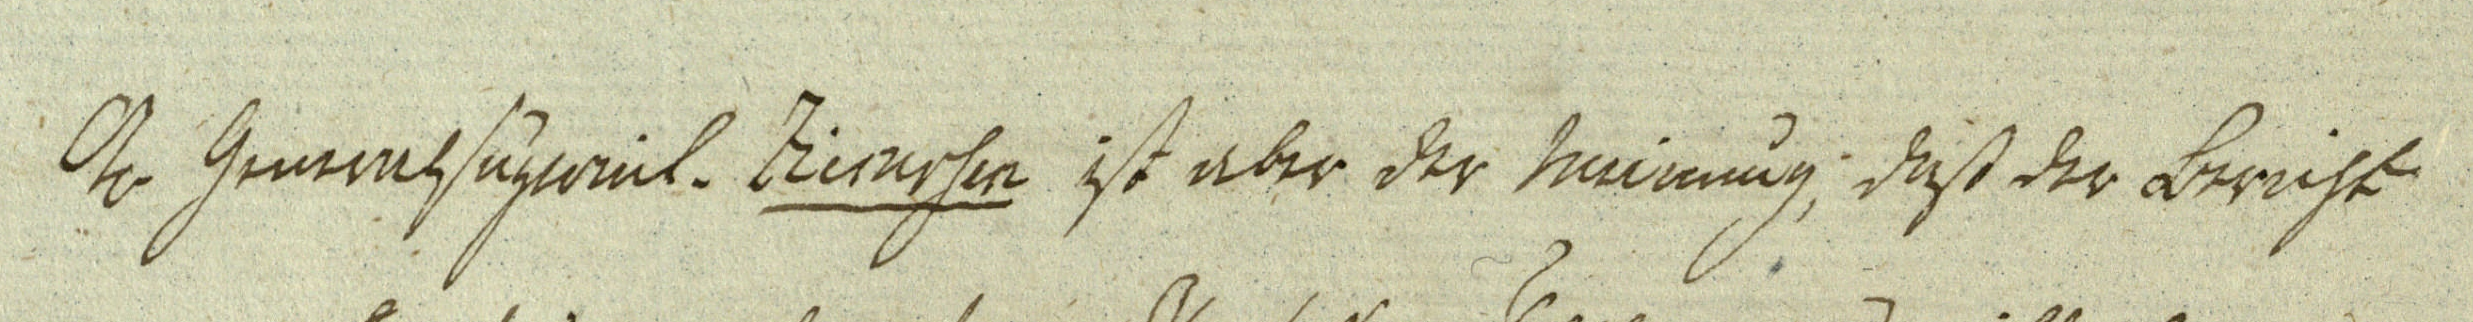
dh. Generalsuperint. Ziemssen ist aber der Meinung, daß der Bericht
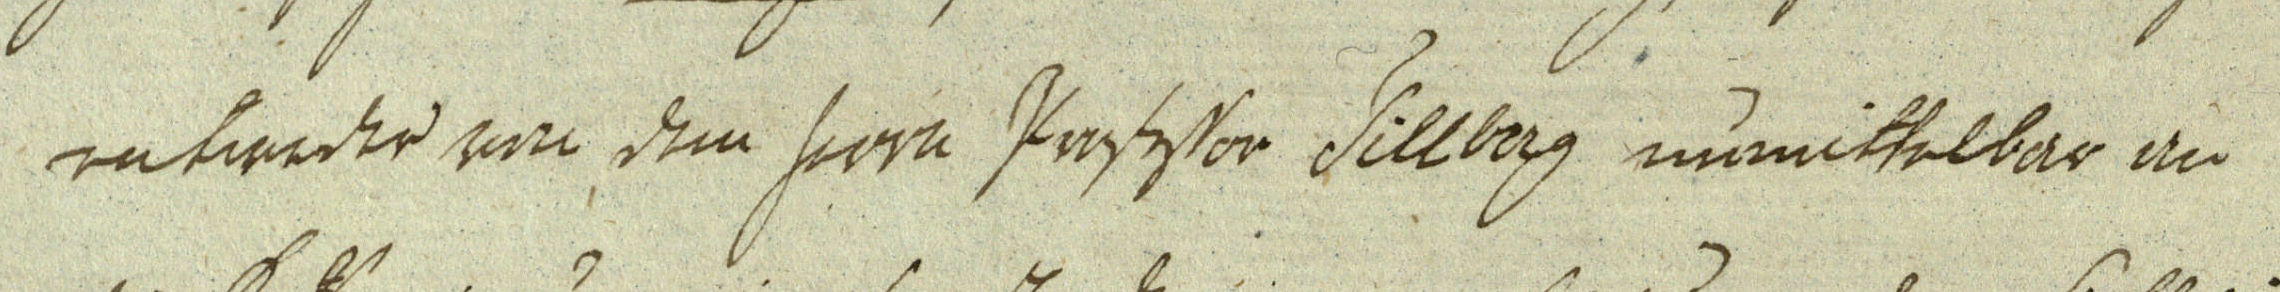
entweder von dem Herrn Professor Tillberg unmittelbar an
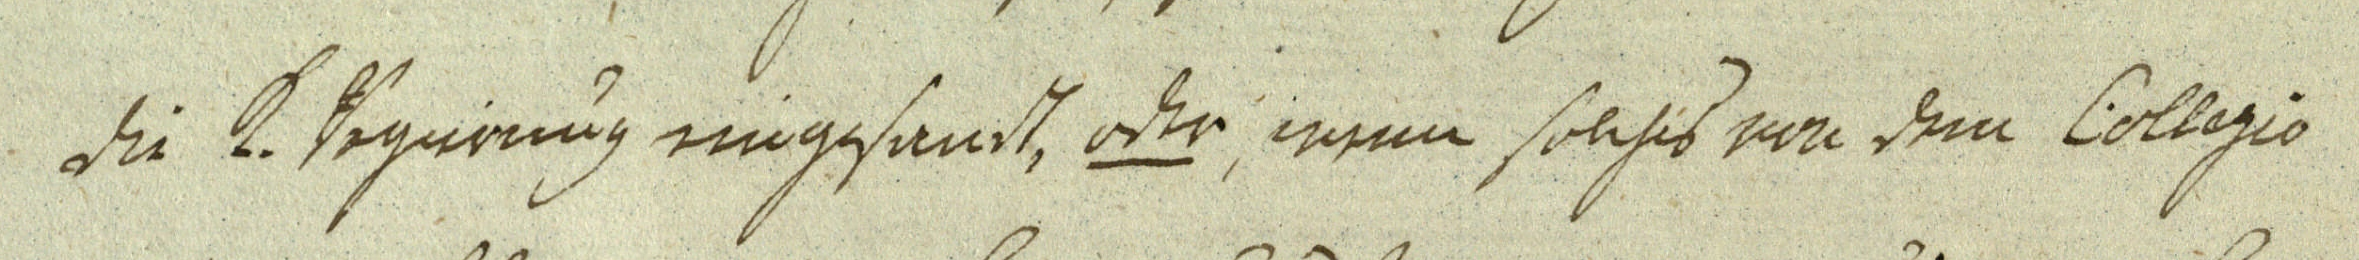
die K. Regierung eingesandt, oder, wenn solches von dem Collegio
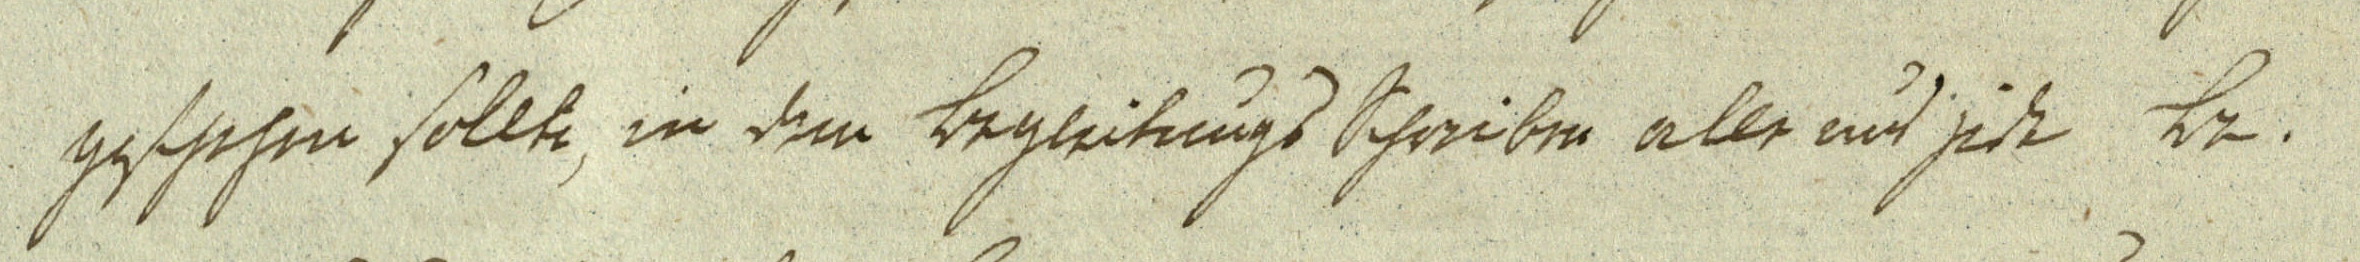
geschehen sollte, in dem Begleitungs Schreiben alle und jede Be¬
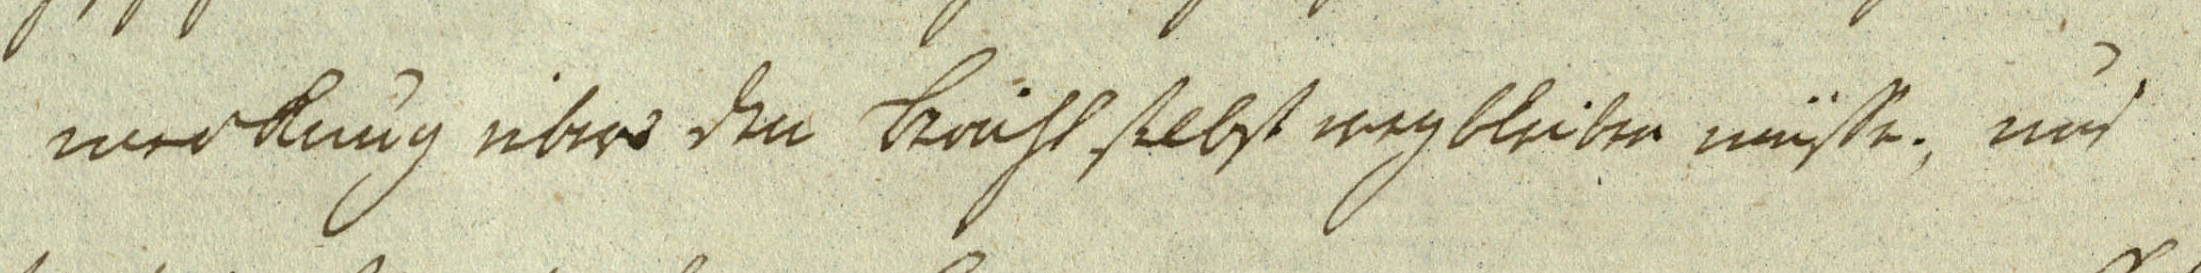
merkung über den Bericht selbst wegbleiben müsse., und
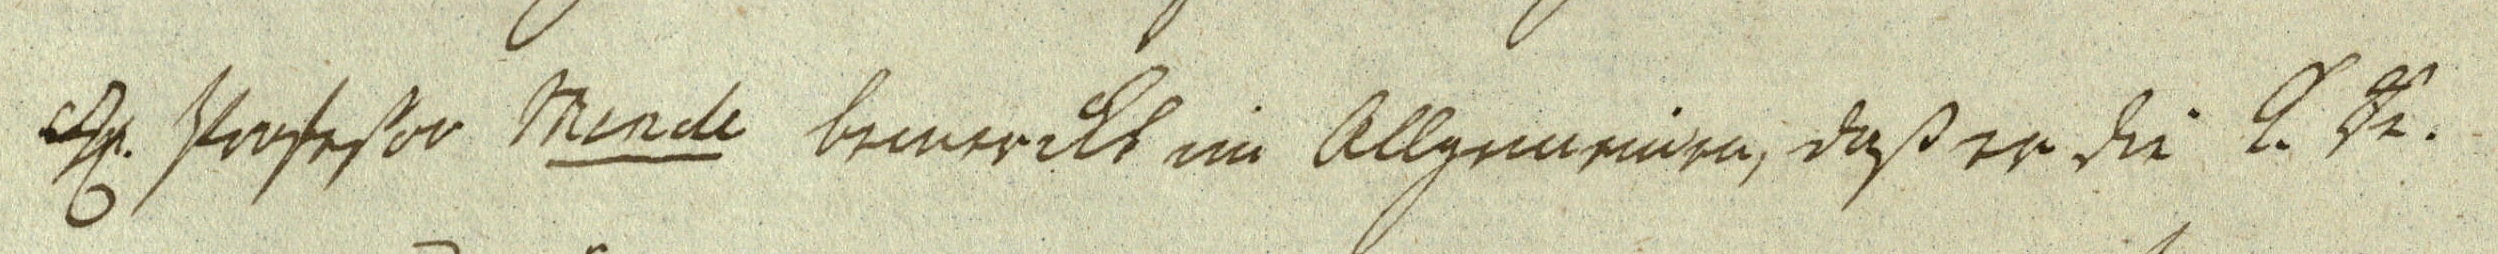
dh. Professor Mende bemerckt im Allgemeinen, daß er die K Re¬
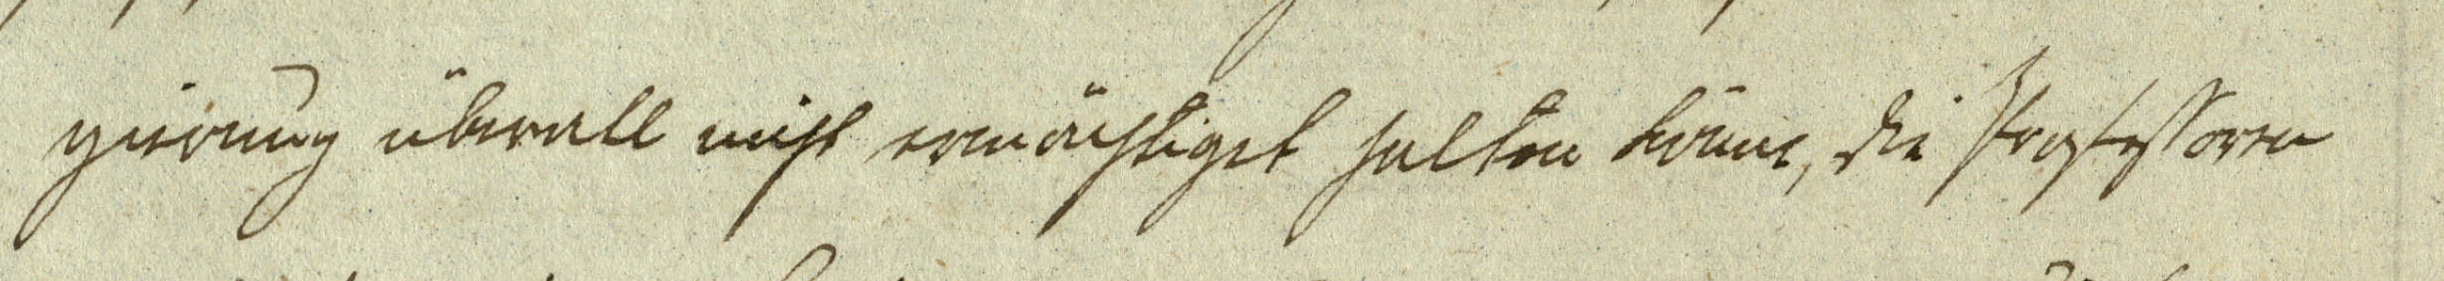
gierung überall nicht ermächtiget halten könne, die Professoren
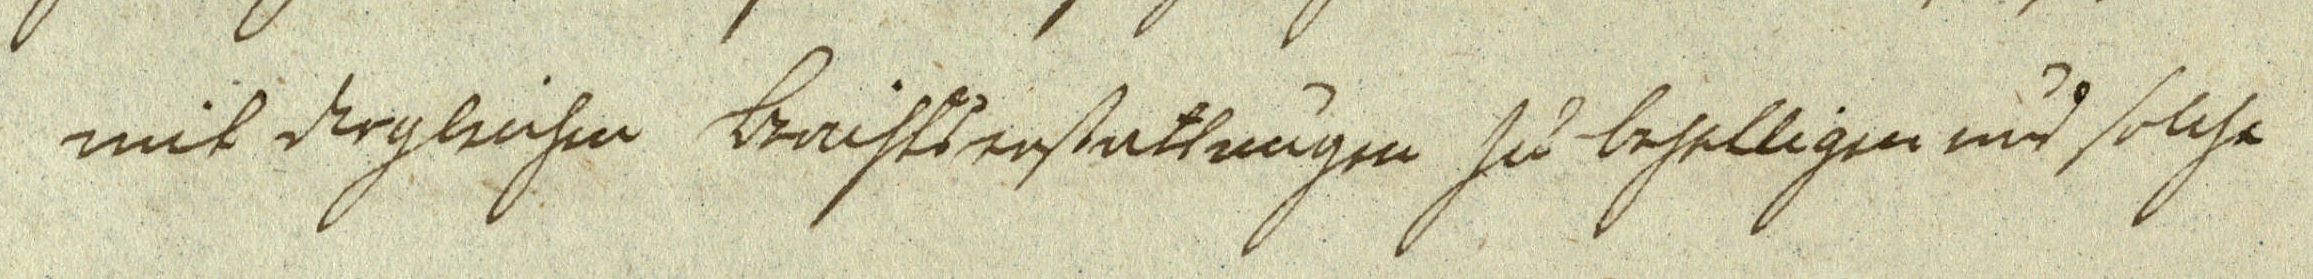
mit dergleichen Berichtserstattungen zu behelligen und solche
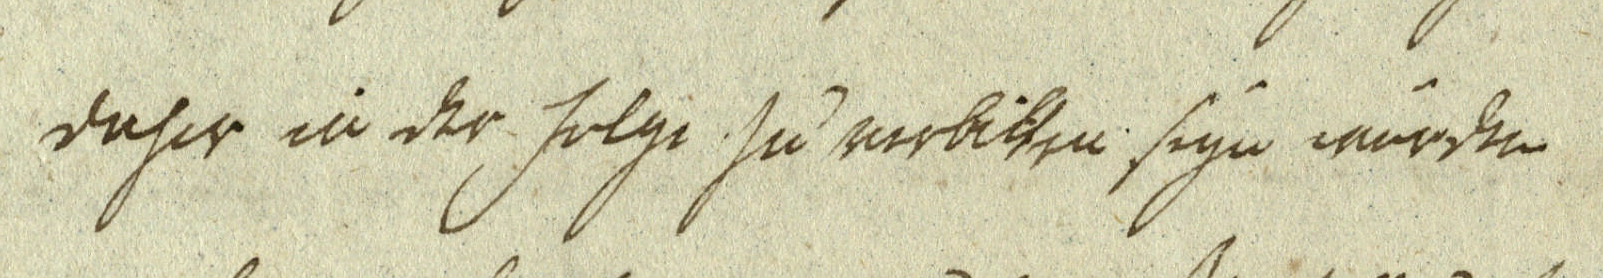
daher in der Folge zu verbitten seÿn würden.
